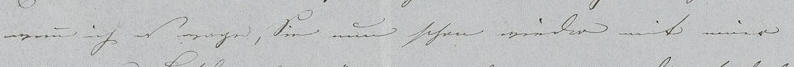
wenn ich es wage, Sie nun schon wieder mit einer
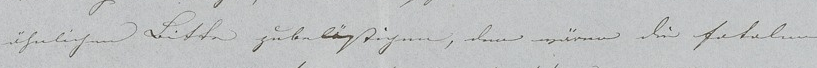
ähnlichen Bitte zubelästigen, den wären die fatalen
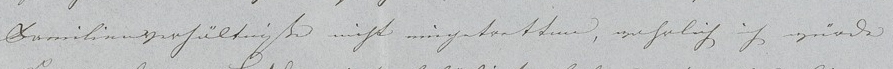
Familienverhältniße nicht eingetretten, wahrlich ich würde
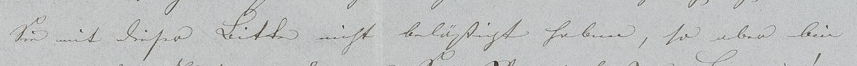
Sie mit dieser Bitte nicht belästigt haben, so aber bin
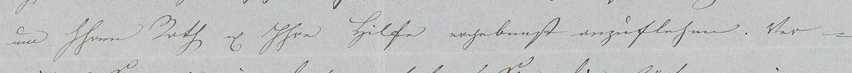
um Ihren Rath & Ihre Hilfe ergebenst anzuflehen. Ver-
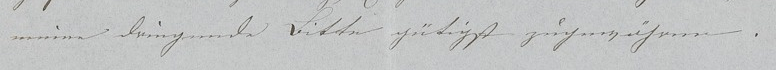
meine dringende Bitte gütigst zugewähren. –
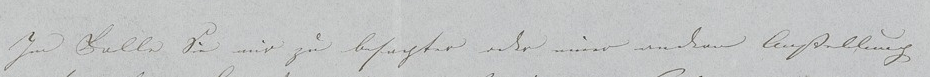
Im Falle Sie mir zu besagter oder einer andern Anstellung
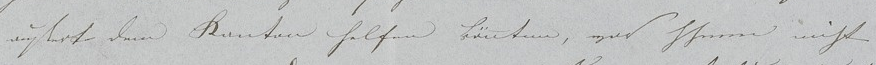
außert dem Kanton helfen könnten, was Ihnen nicht
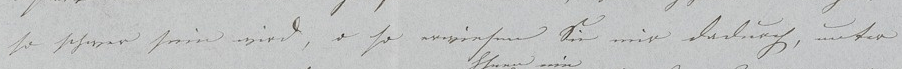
so schwer sein wird, o so erwiesen Sie mir dadurch, unter
